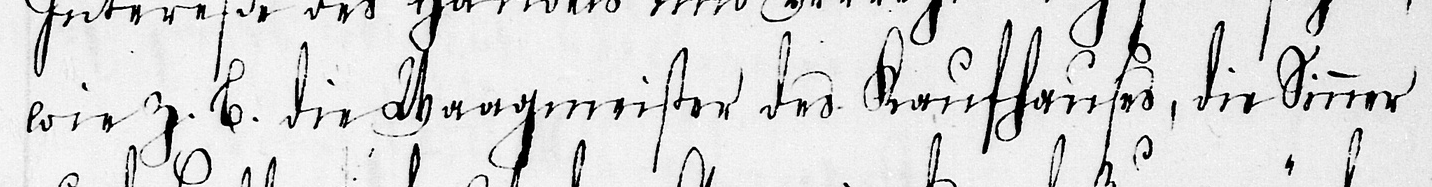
wie z. B. die Waagmeister des Kaufhauses, die Sinner
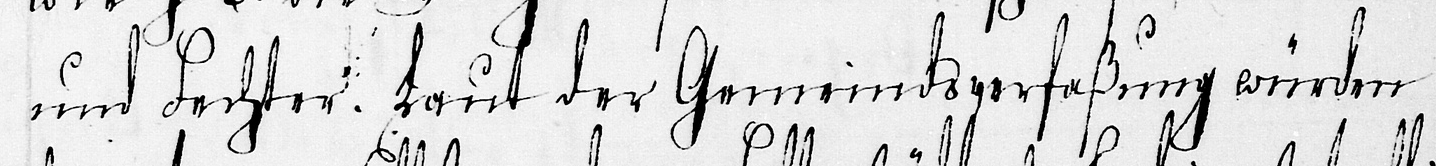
und Fechter. Laut der Gemeindsverfaßung würden
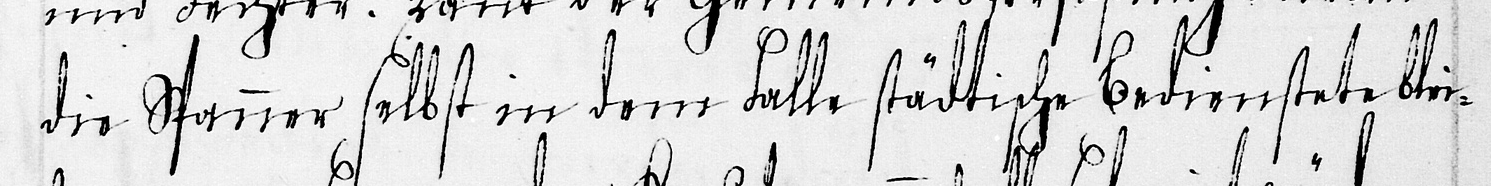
die Spanner selbst in dem Falle städtische Bedienstete blei¬
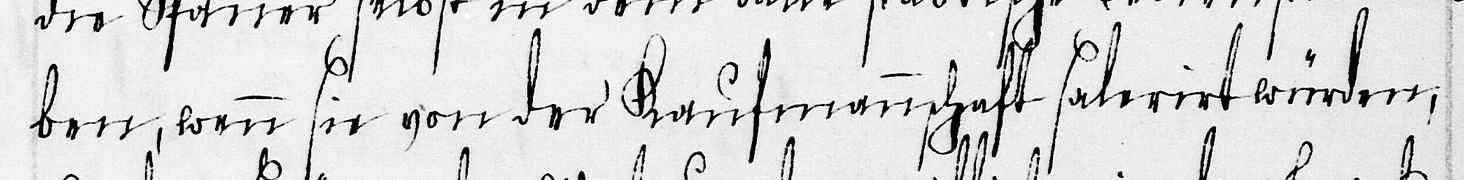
ben, wenn sie von der Kaufmannschaft salerirt würden,
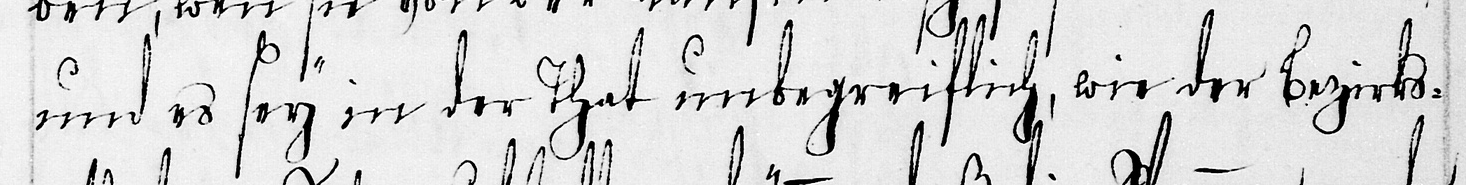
und es sey in der That unbegreiflich, wie der Bezirks¬
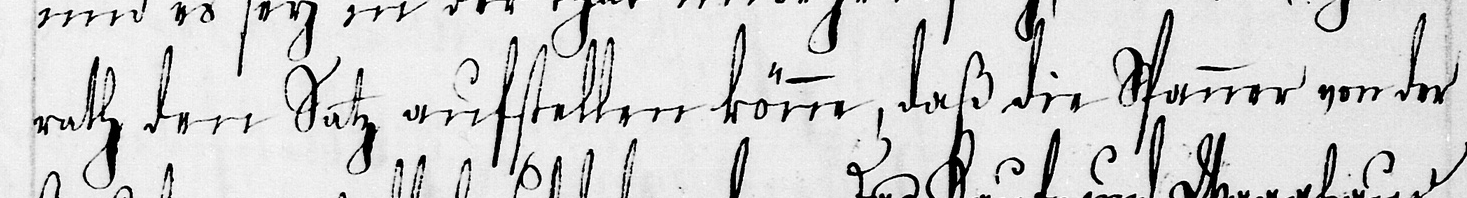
rath den Satz aufstellen könne, daß die Spanner von der
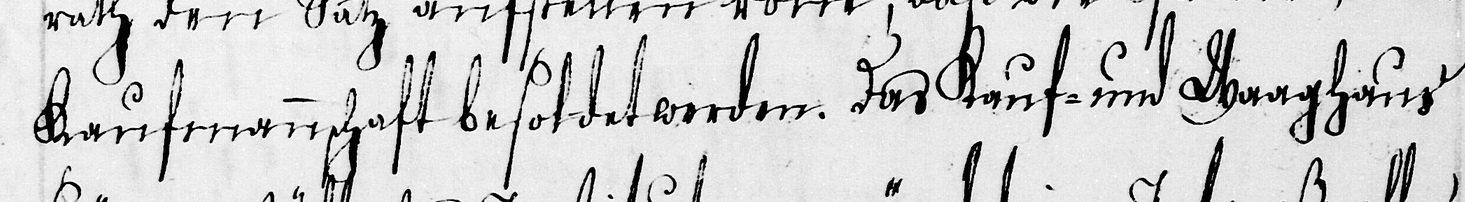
Kaufmannschaft besoldet werden. Das Kauf- und Waaghaus
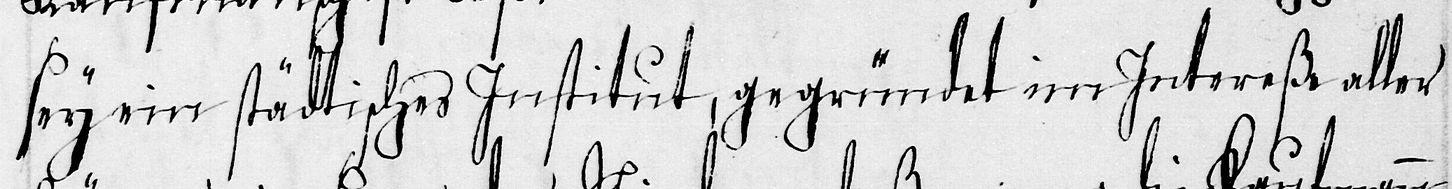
sey ein städtisches Institut, gegründet im Intereße aller
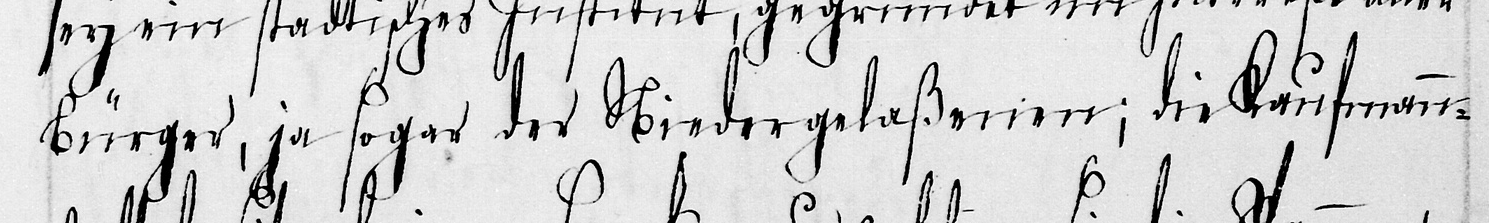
Bürger, ja sogar der Niedergelaßenen, die Kaufmann¬
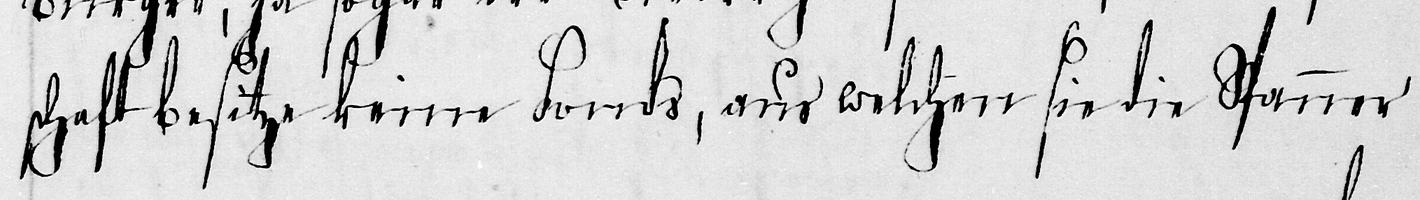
schaft besitze keine Fonds, aus welchen sie die Spanner
